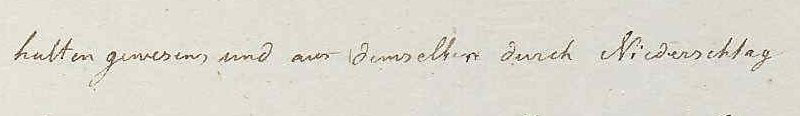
halten gewesen, und aus demselben durch Niederschlag
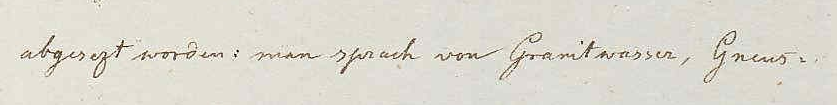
abgesezt worden: man sprach von Granitwasser, Gneus-
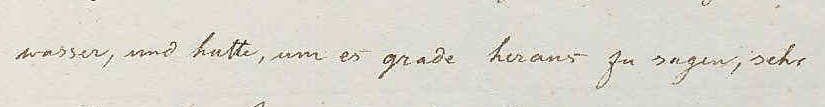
wasser, und hatte, um es grade heraus zu sagen, sehr
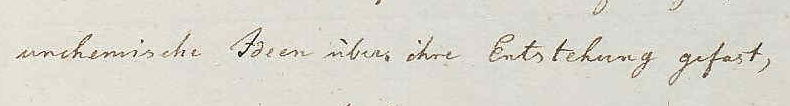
unchemische Ideen über ihre Entstehung gefast,
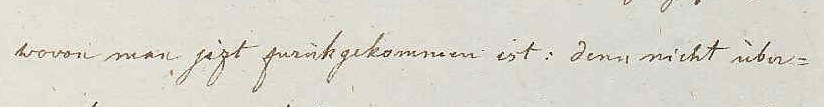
wovon man jezt zurükgekommen ist: denn nicht über-
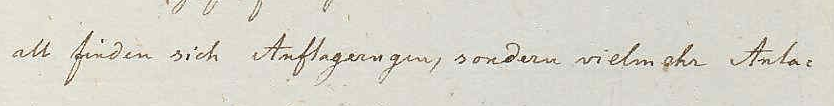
all finden sich , sondern vielmehr Anla-
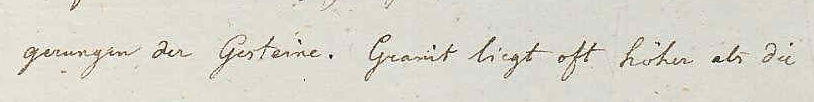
gerungen der Gesteine. Granit liegt oft höher als die
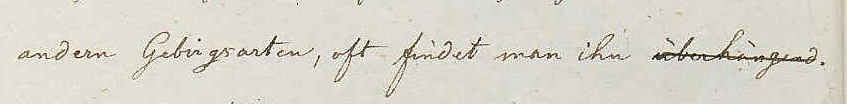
andern Gebirgsarten, oft findet man ihn überhängend.
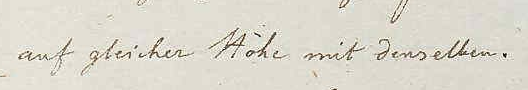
auf gleicher Höhe mit denselben.
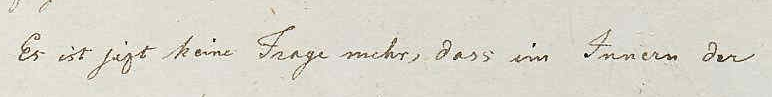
Es ist jezt keine Frage mehr, dass im Innern der
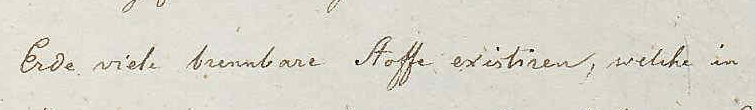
Erde viele brennbare Stoffe existiren, welche in
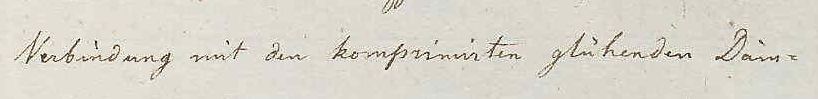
Verbindung mit den komprimirten glühenden Däm-
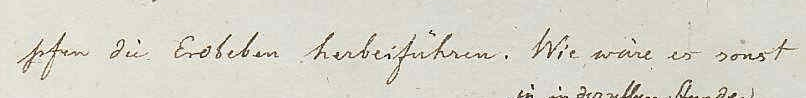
pfen die Erdbeben herbeiführen. Wie wäre es sonst
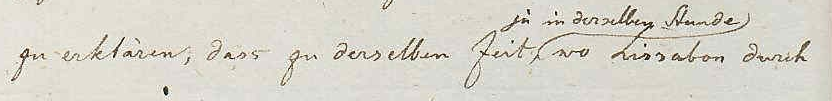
zu erklären, dass zu derselben Zeit, ja in derselben Stunde
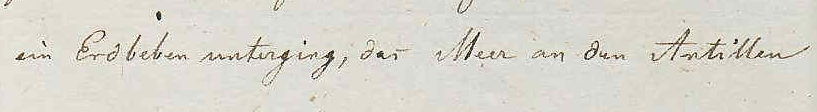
ein Erdbeben unterging, das Meer an den Antillen
